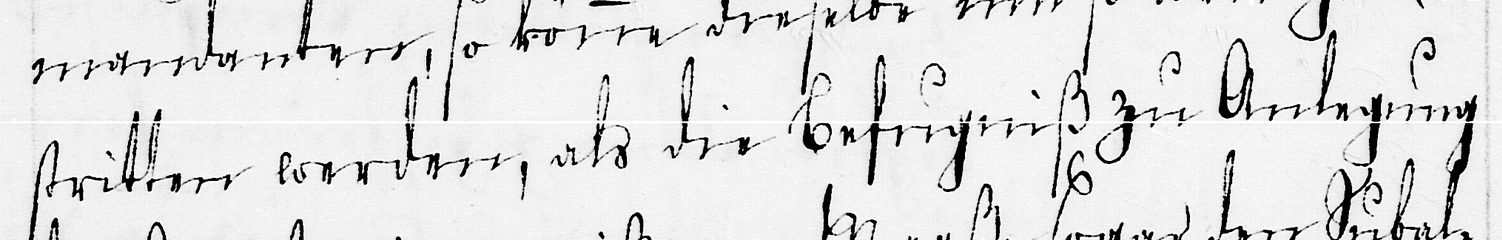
stritten werden, als die Befugniß zu Anlegung
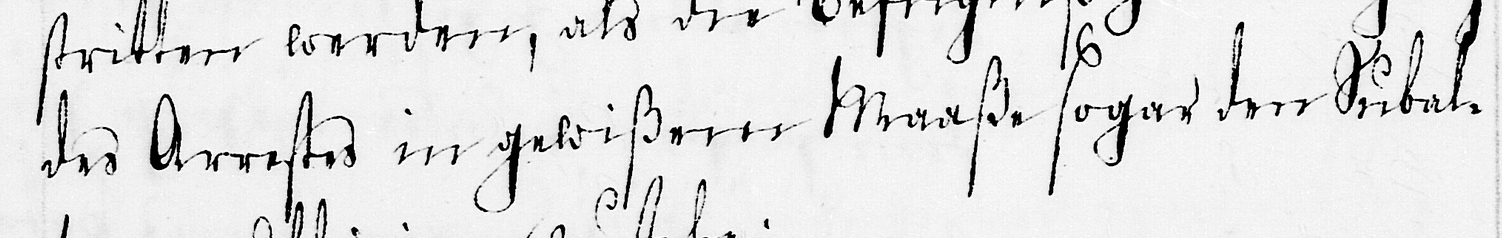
des Arrestes in gewißem Maaße sogar den Subal¬
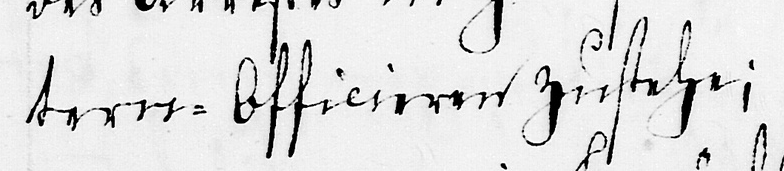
tern-Officieren zustehe;
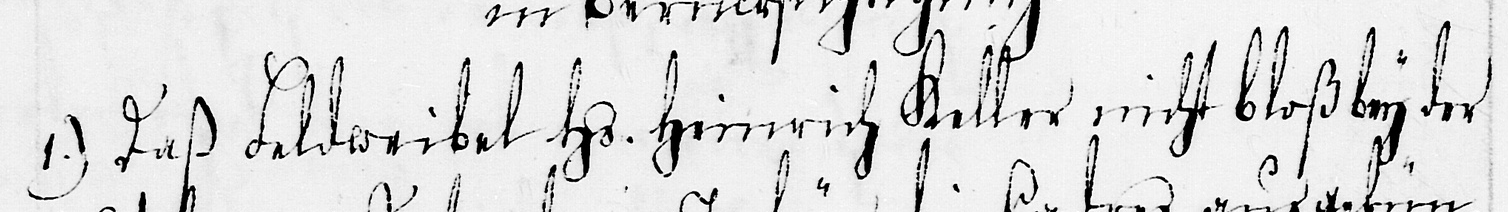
1.) Daß Feldweibel Hs. Heinrich Keller nicht bloß bey der
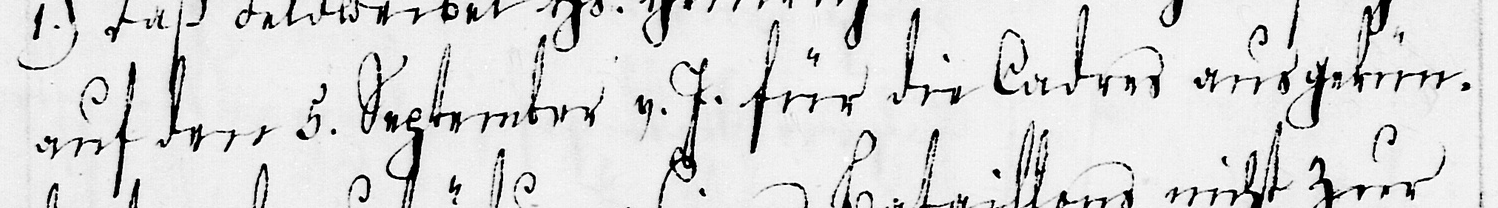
auf den 5. September v. J. für die Cadres ausgekün¬
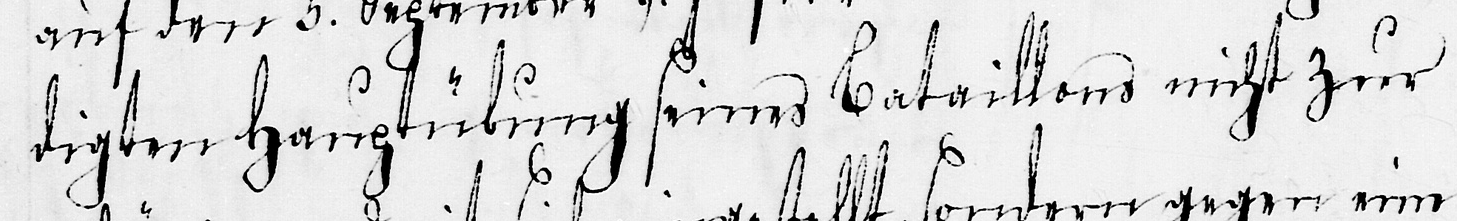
digten Hauptübung seines Bataillons nicht zur
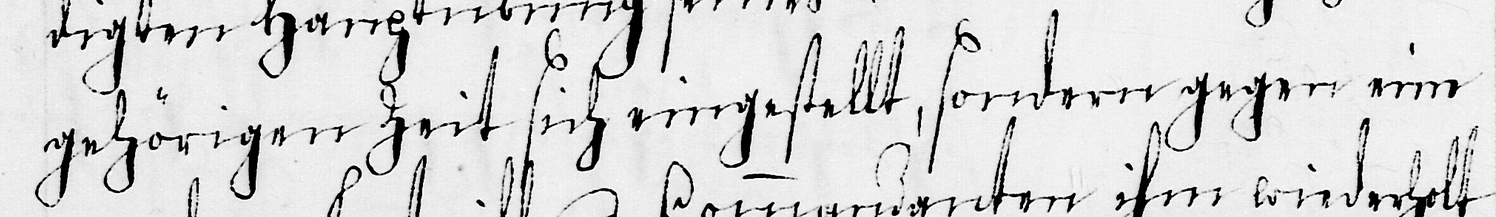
gehörigen Zeit sich eingestellt, sondern gegen eine
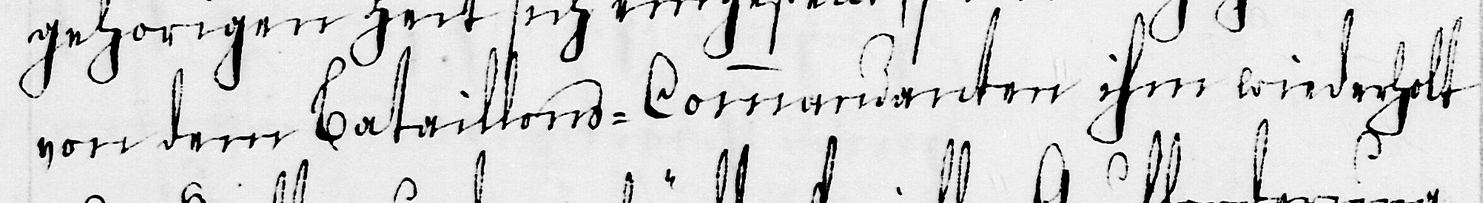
von dem Bataillons-Commandanten ihm wiederholt
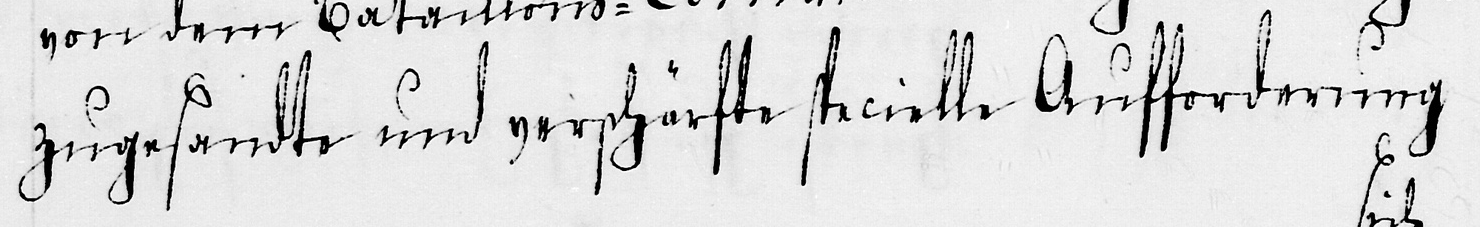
zugesandte und verschärfte specielle Aufforderung
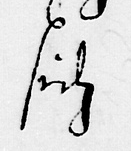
ich
